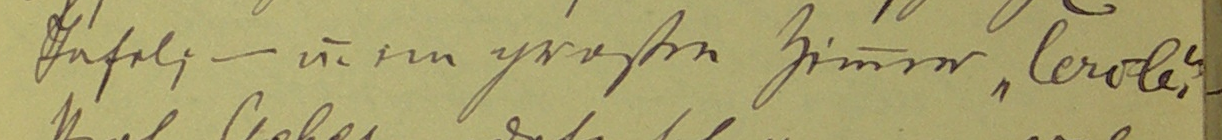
Tafel.—u. im großen Zimmer ???
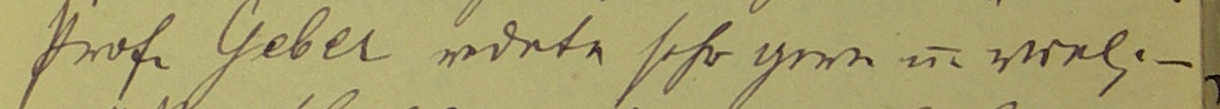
Prof. Geber redete sehr gerne und viel; -
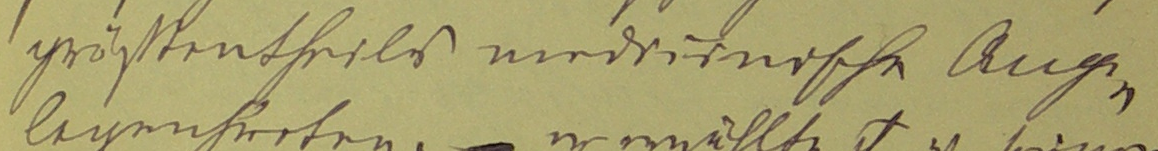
größtentheils neudeisnische Ange¬
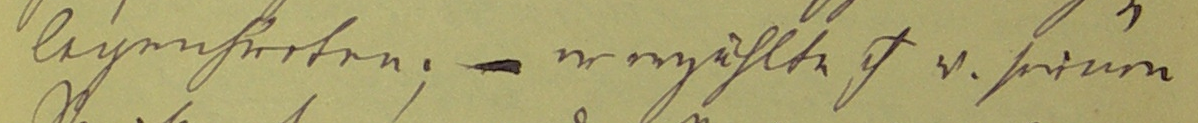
legenheiten; - er erzählte auch v. seinen
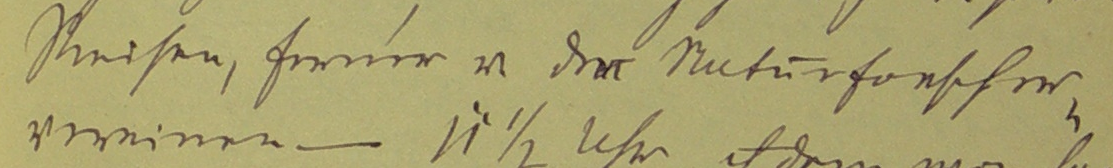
Reisen, ferner v. den Naturforscher¬
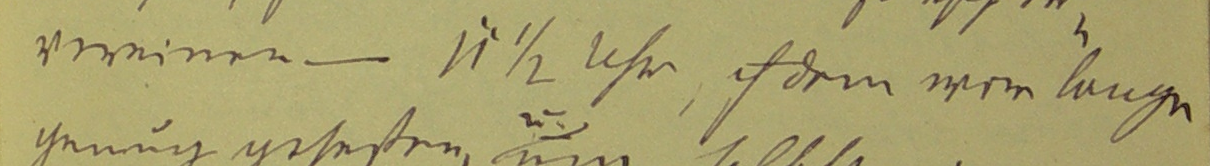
vereinen.- 11 ½ Uhr, nachdem wir lange
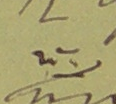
u.
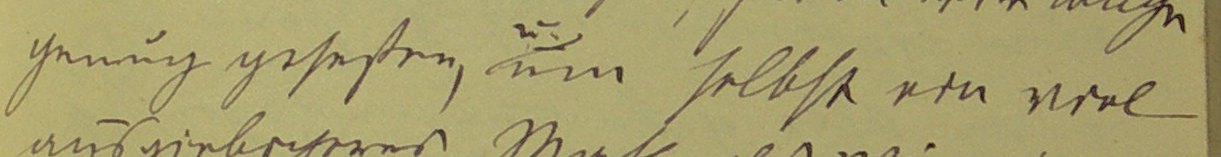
genug geseßen, um selbst ein viel
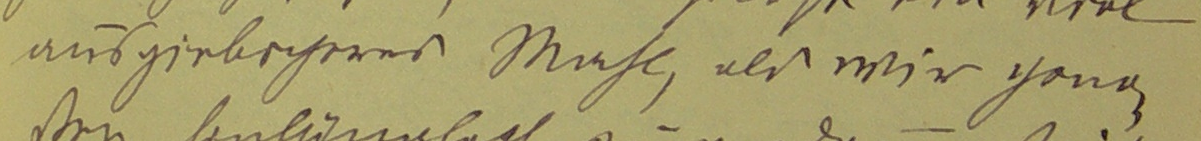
ausgiebigeres Mahl, als wir geno¬
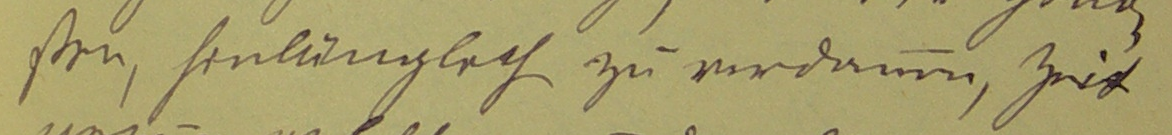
ßen, hinlänglich zu verdauen, Zeit
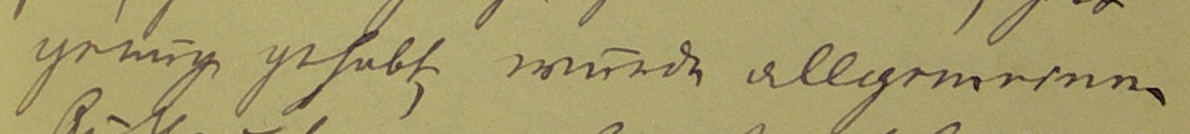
genug gehabt, wurde allgemeiner
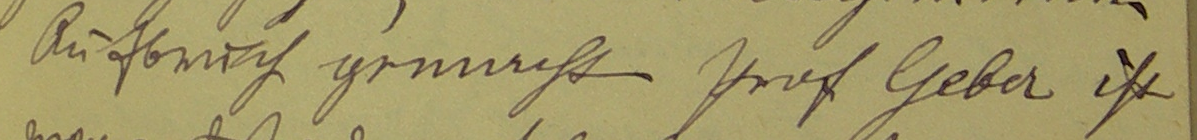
Aufbruch gemacht.- Prof. Geber ist
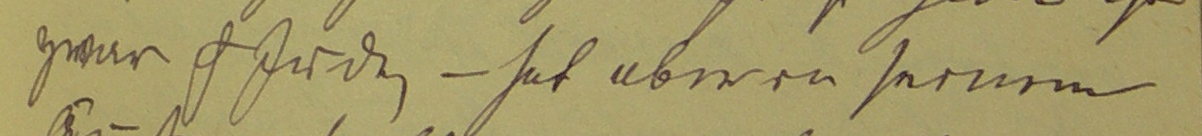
zwar ??? Jude – hat aber in seinem
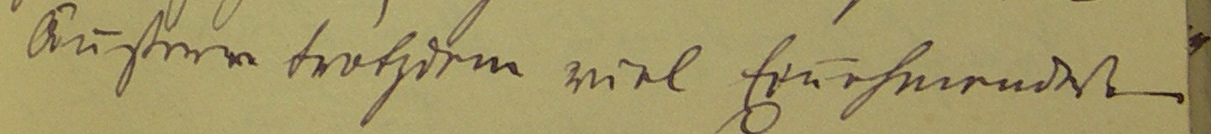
Äußeren trotzdem viel Einnehmendes
